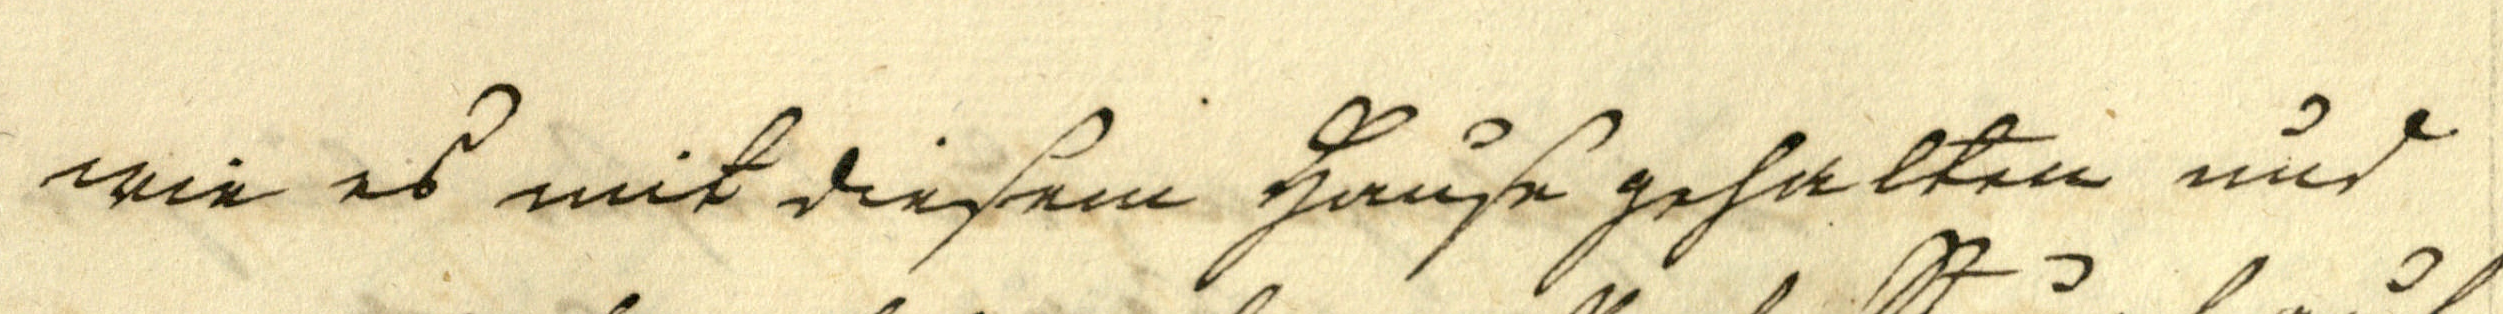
wie es mit diesem Hause gehalten und
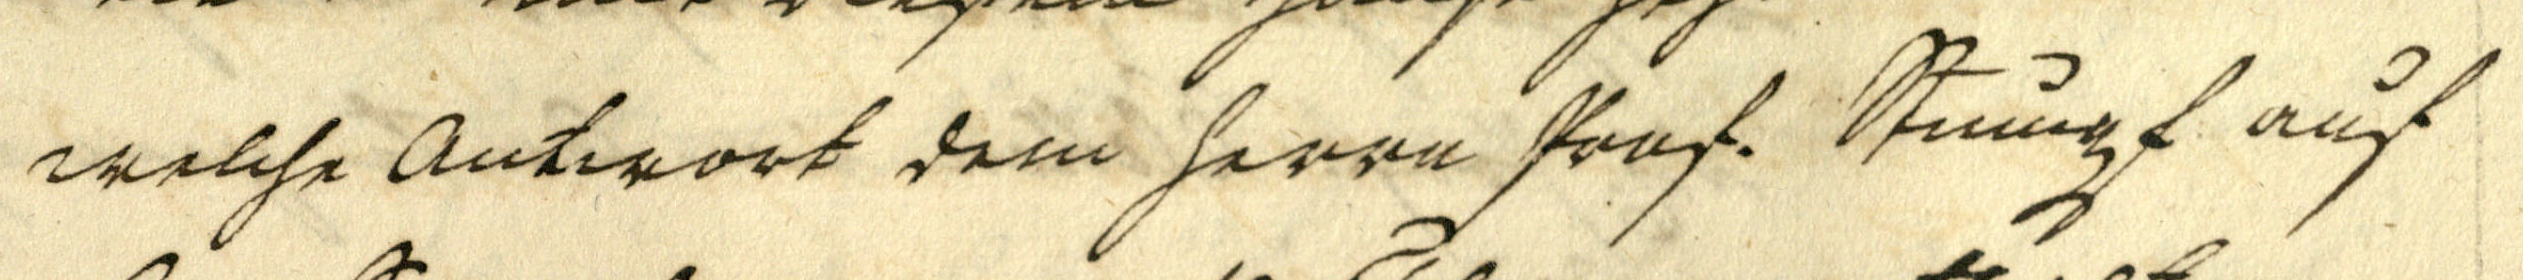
welche Antwort dem Herrn Prof. Stumpf auf
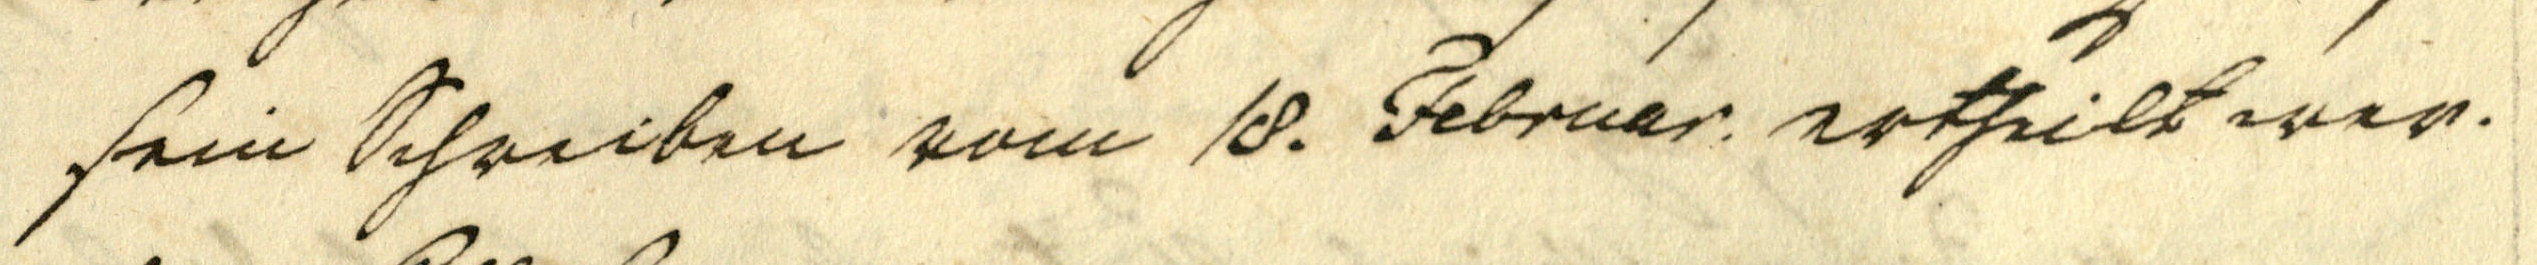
sein Schreiben vom 18. Februar. ertheilt wer¬
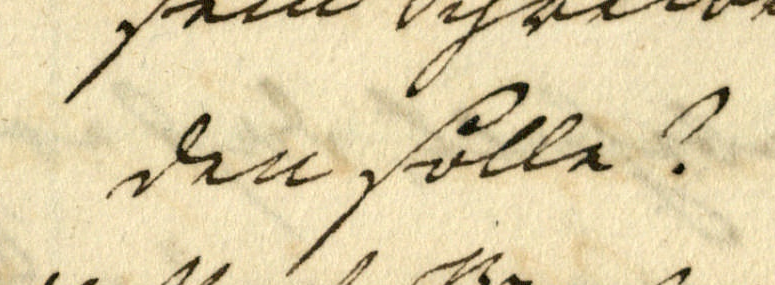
den solle?
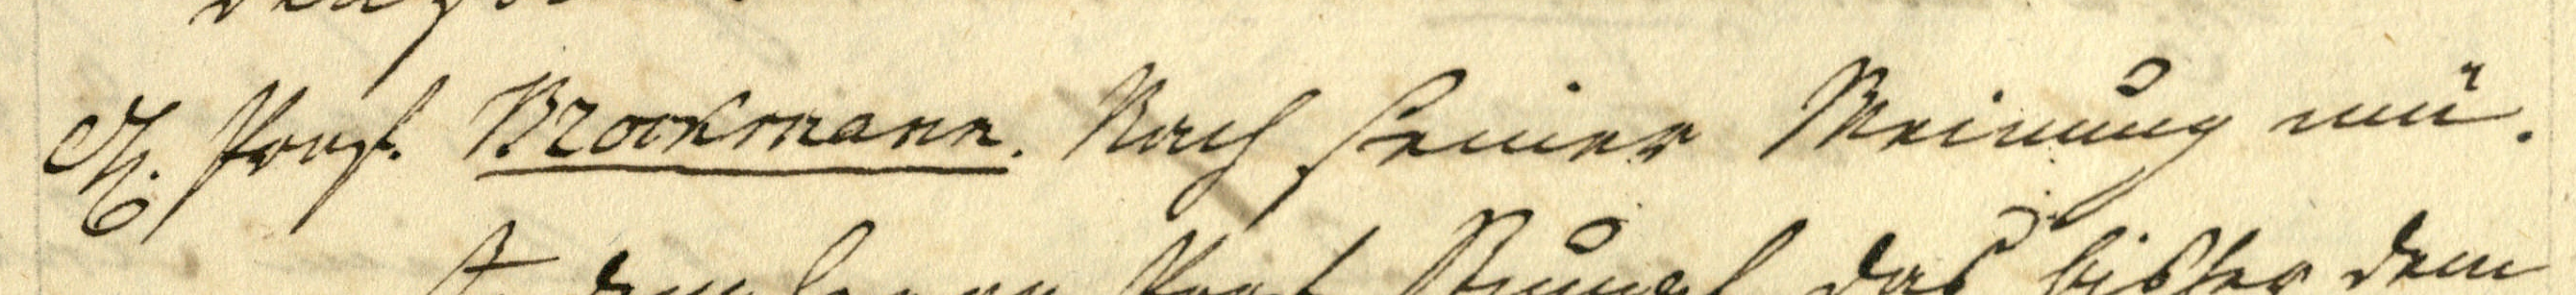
dh. Prof. Brockmann. Nach seiner Meinung mü¬
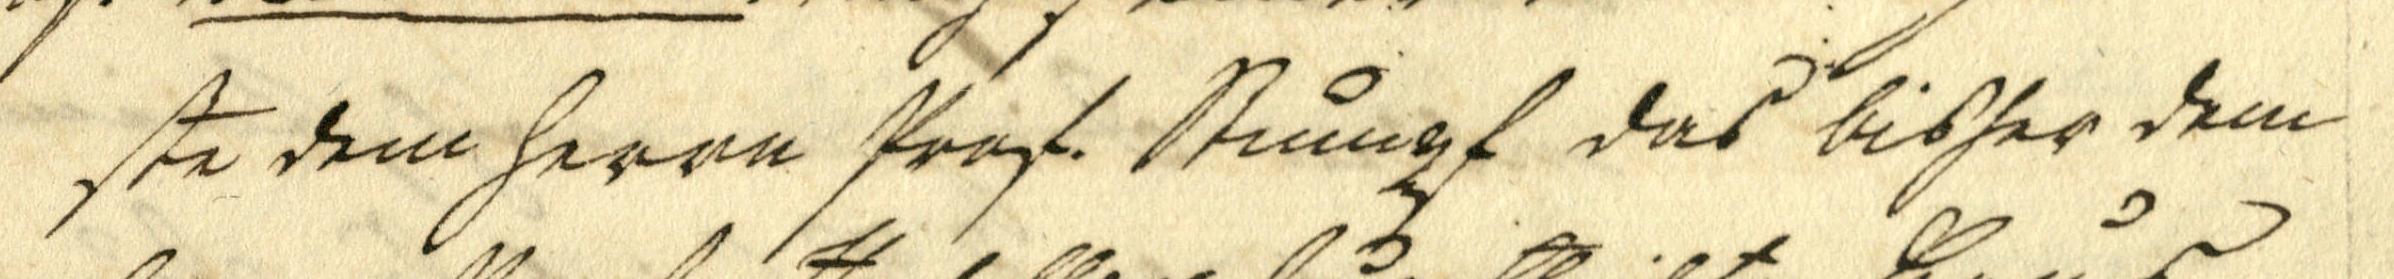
ßte dem Herrn Prof. Stumpf das bisher dem
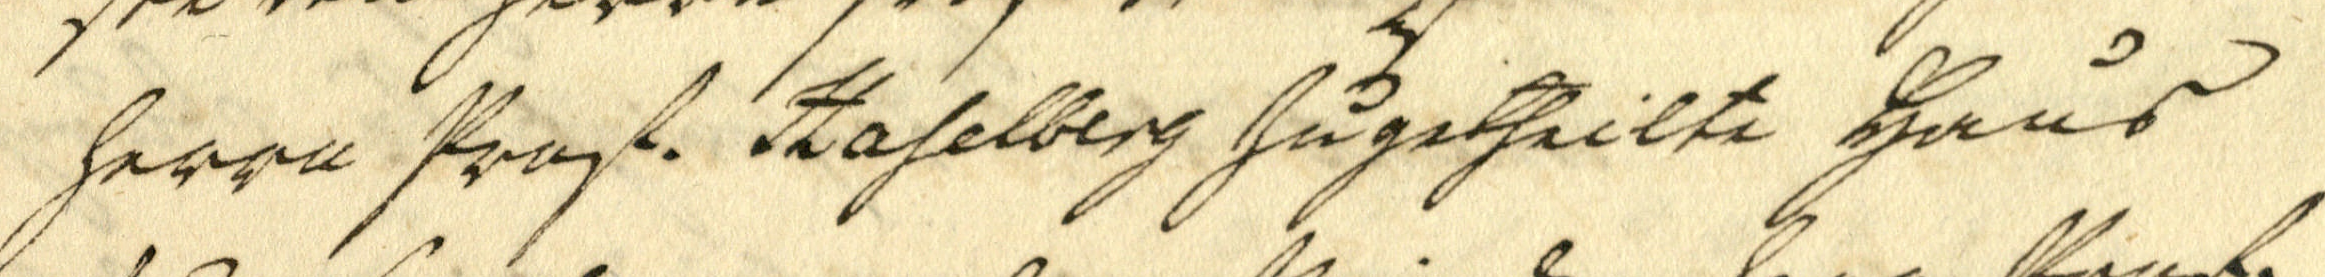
Herrn Prof. Haselberg zugetheilte Haus
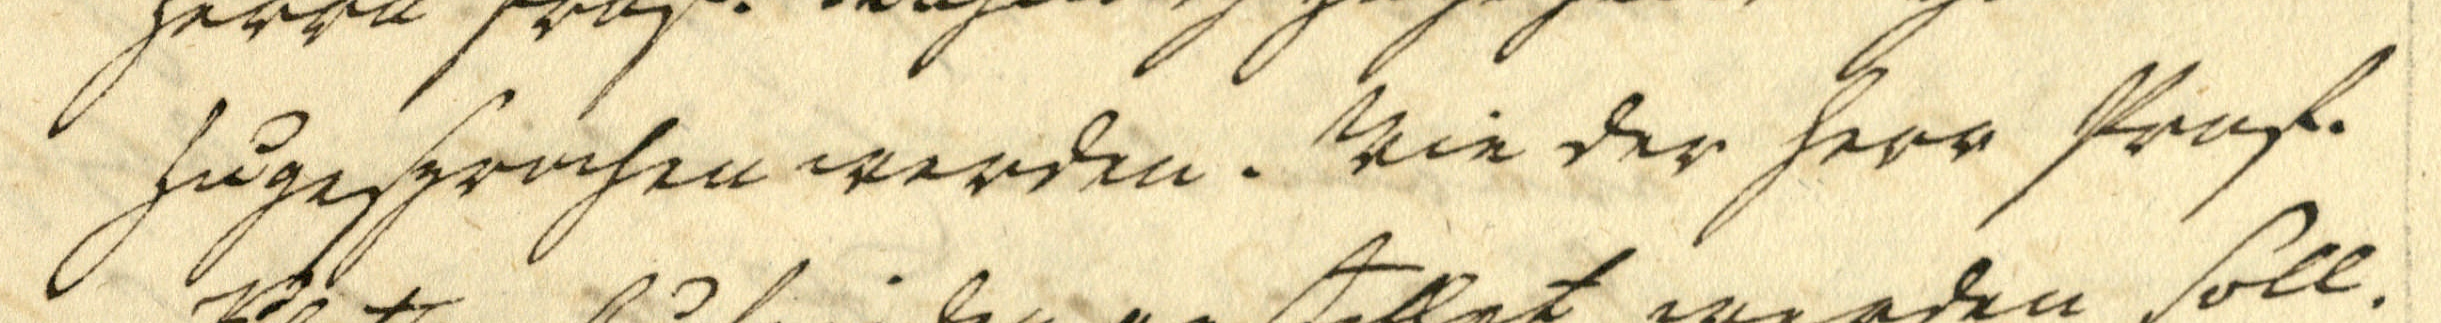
zugesrochen werden. Wie der Herr Prof.
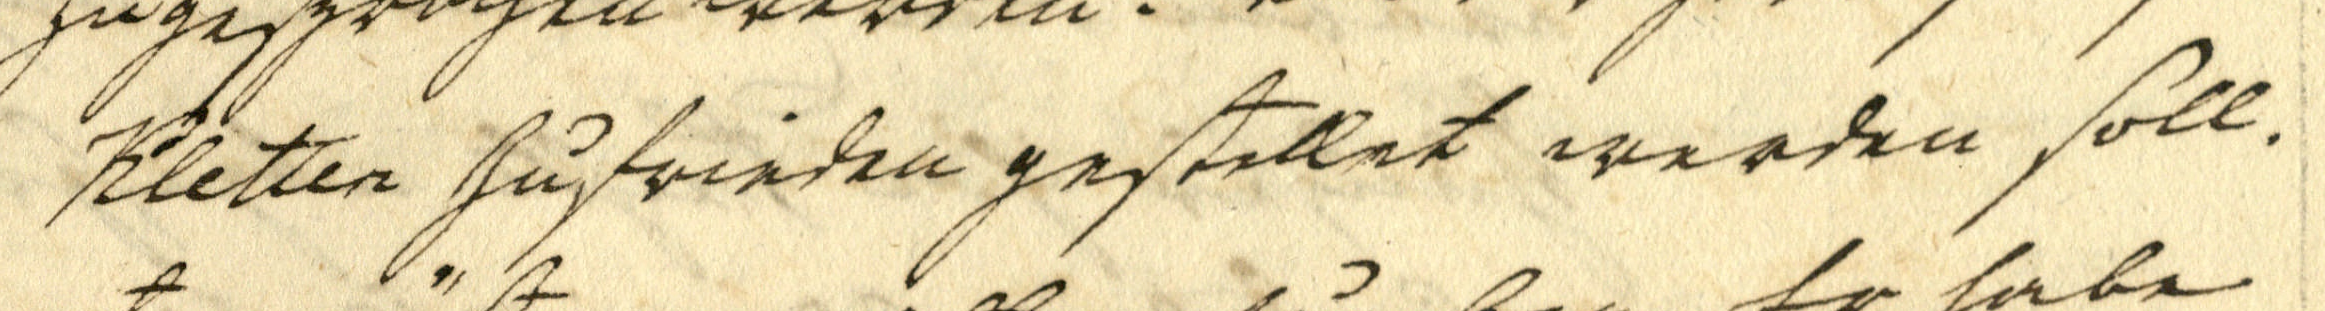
Kletten zufrieden gestellet werden soll¬
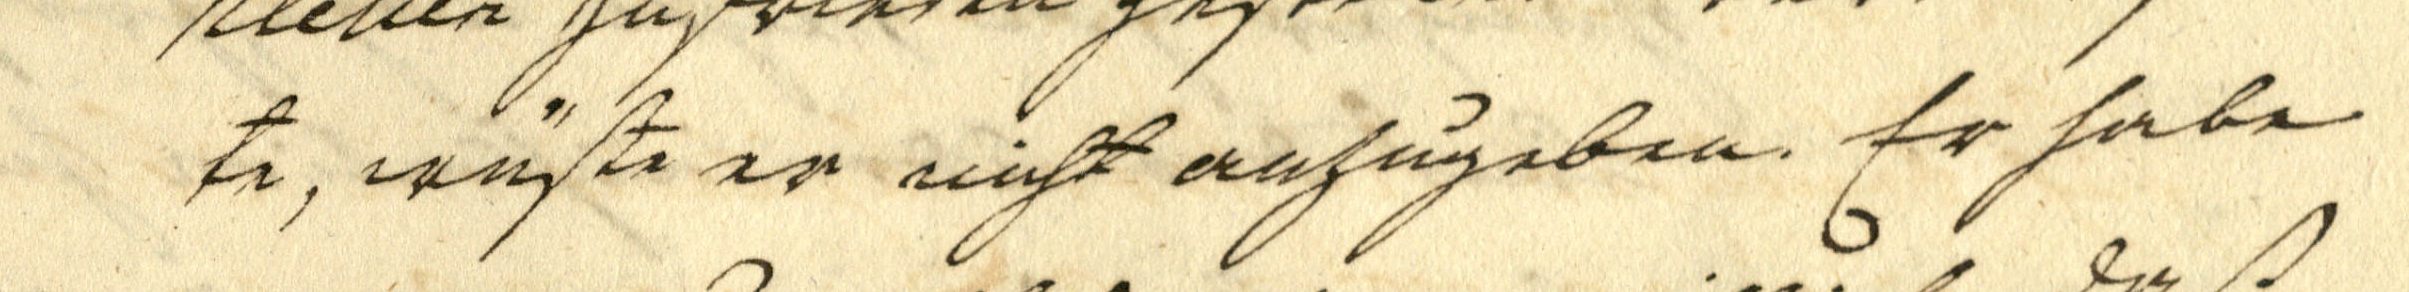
te, wüßte er nicht anzugeben. Er habe
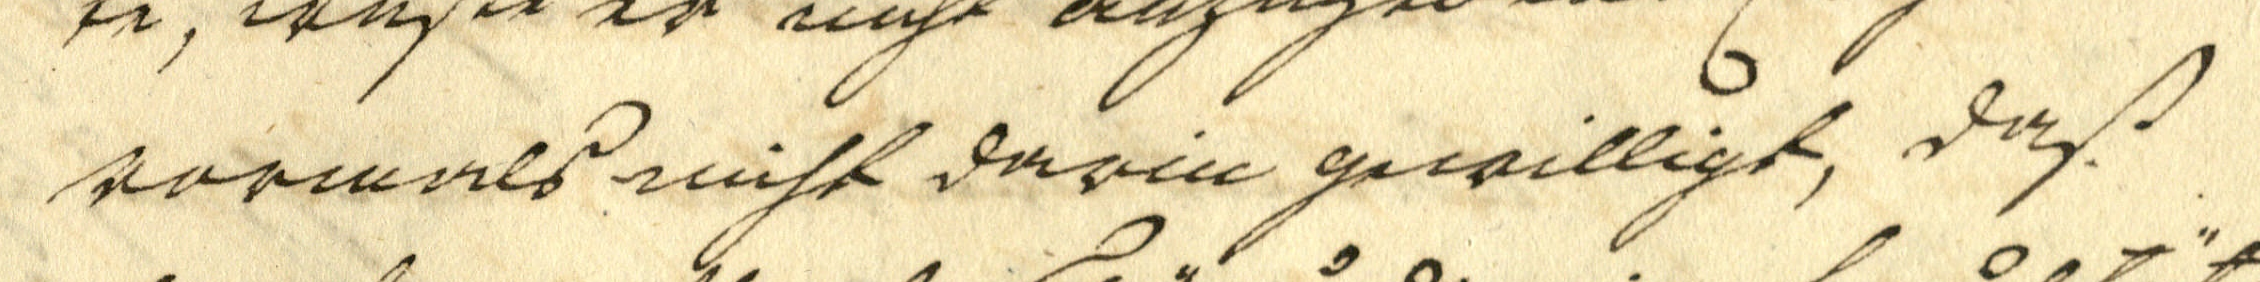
vormals nicht darin gewilligt, daß
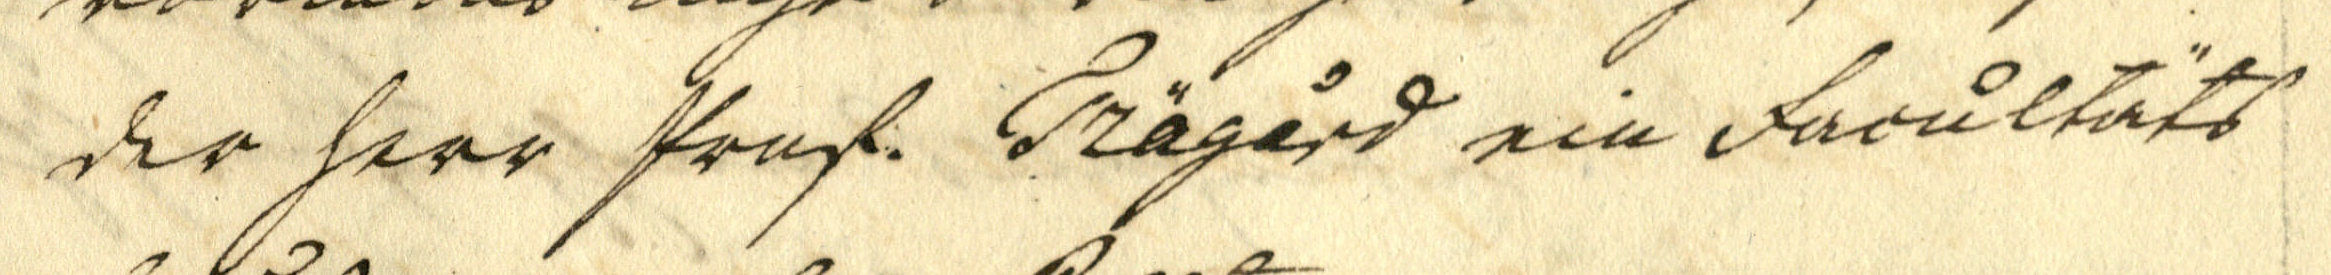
der Herr Prof. Trägård ein Facultäts
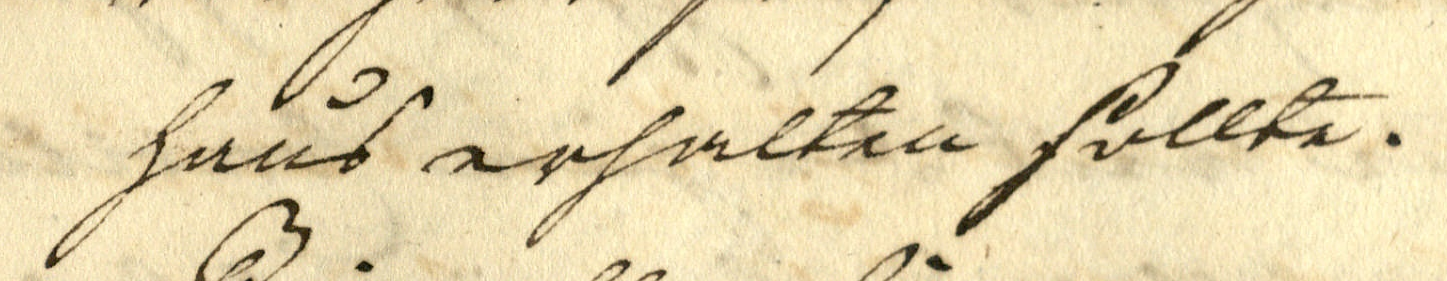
Haus erhalten sollte.
